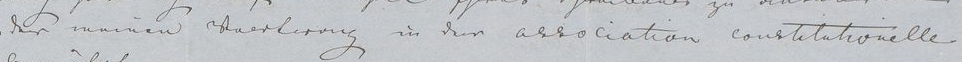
der meinen Vortrag in der association constitutionelle
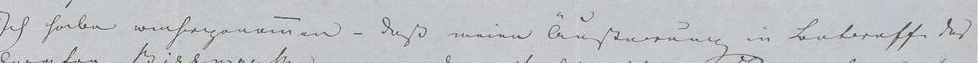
Ich habe wahrgenommen, daß meine Äußerung in Betreff des
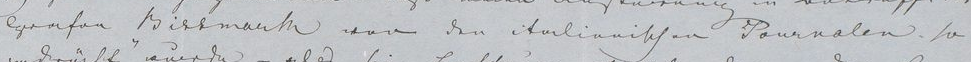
Grafen Bissmark von den italienischen Journalen so
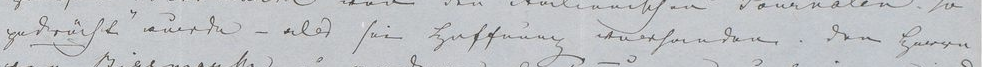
«gedräht» wurde, als sei Hoffnung vorhanden, den Herrn
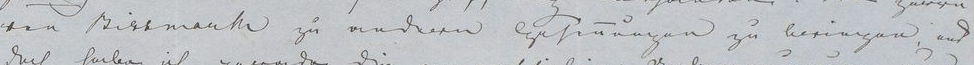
von Bissmark zu andern Gesinnungen zu bringen, und
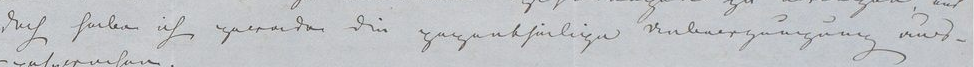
doch habe ich gerade die gegentheilige Ueberzeugung aus-
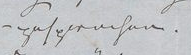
gesprochen.
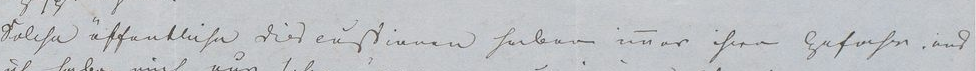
Solche öffentliche Discussionen haben immer ihre Gefahr und
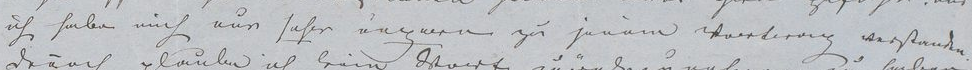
ich habe mich nur sehrungern zu jenem Vortrag verstanden.
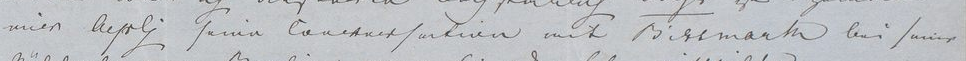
mir Aepli seine Conversation mit Bissmark bei seiner
